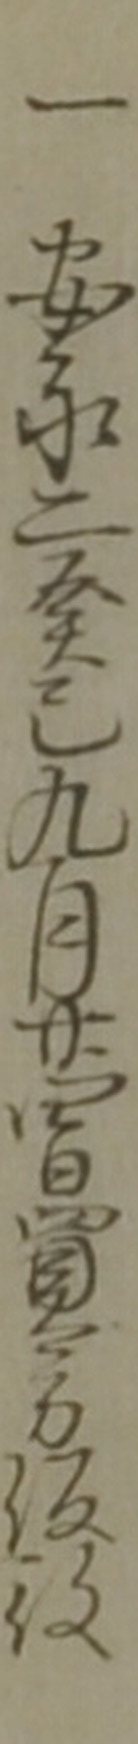一安永二癸巳九月廿四日買方仮役
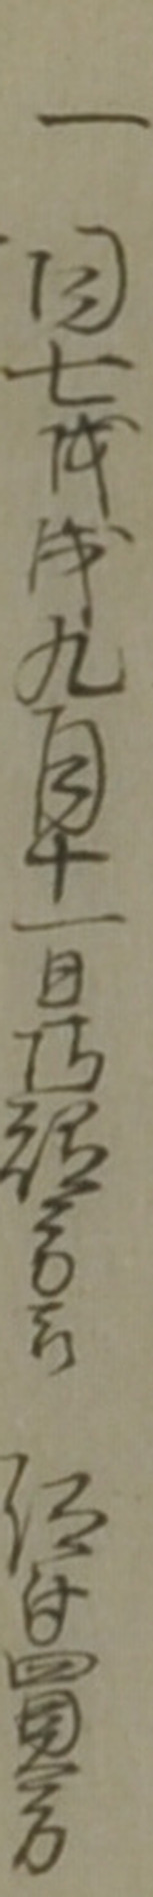一同七戊戌九月十一日御賄方被仰付買方

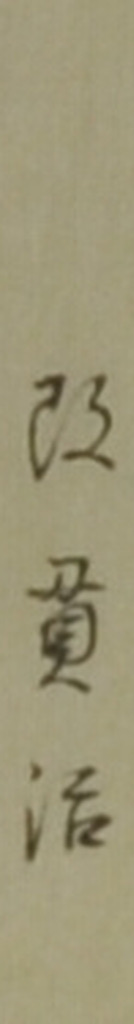改貫次
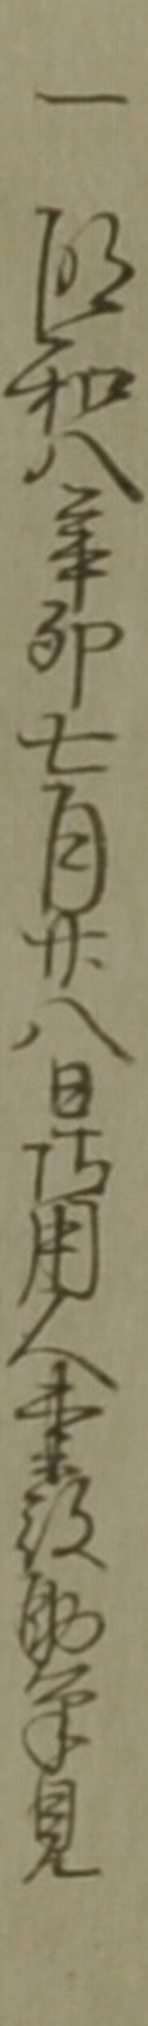一明和八辛卯七月廿八日御用人書役助筆見
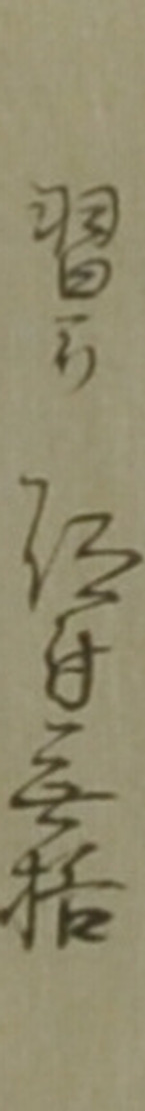習被仰付無格
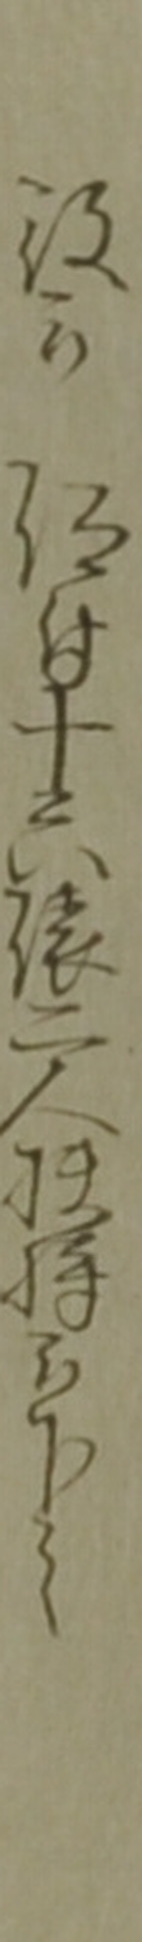役被仰付十六俵二人扶持被下之
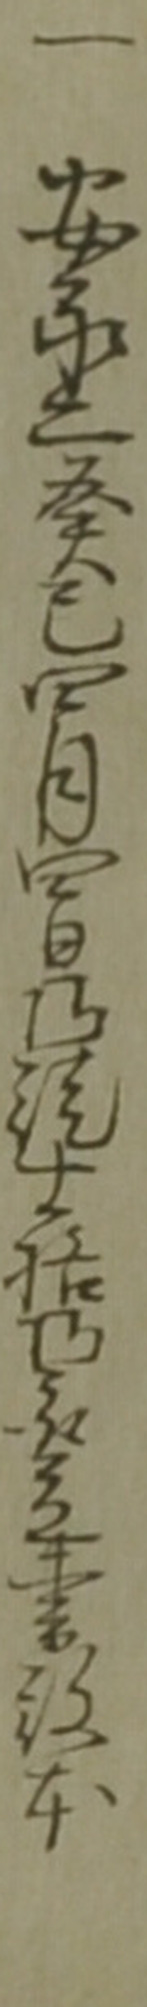一安永二癸巳四月四日御徒士格御取立書役本
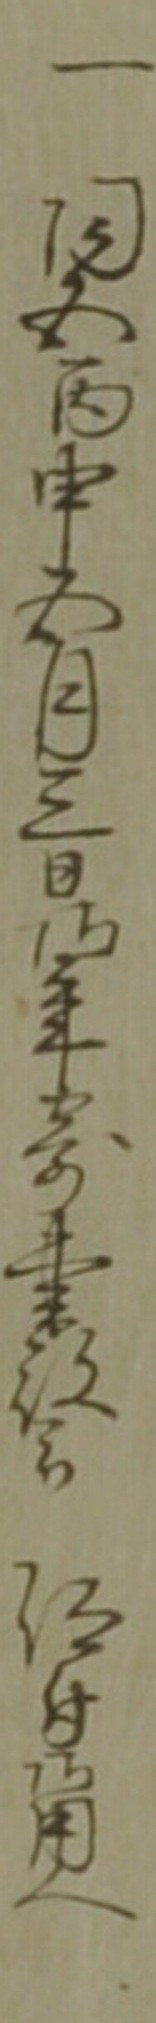一同五丙申五月三日御年寄書役被仰付御用人
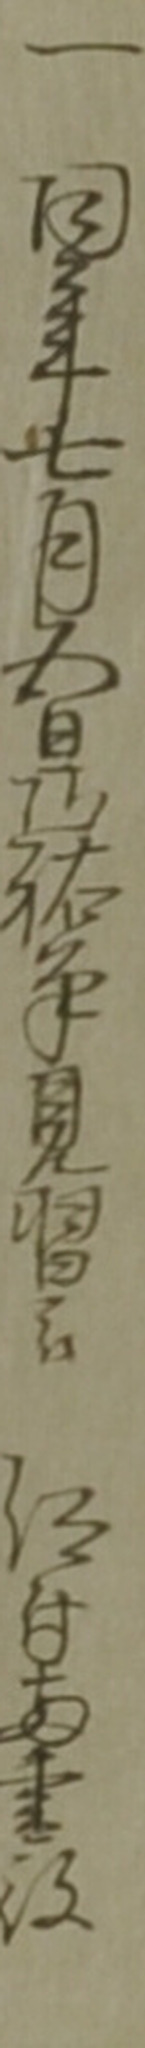一同年七月五日御祐筆見習被仰付両書役
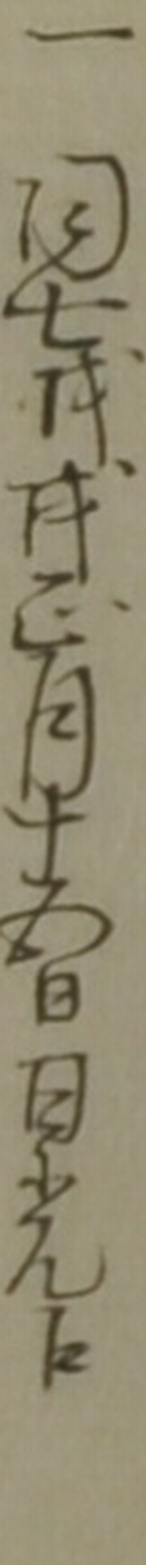一同七戊戌正月十五日日光江
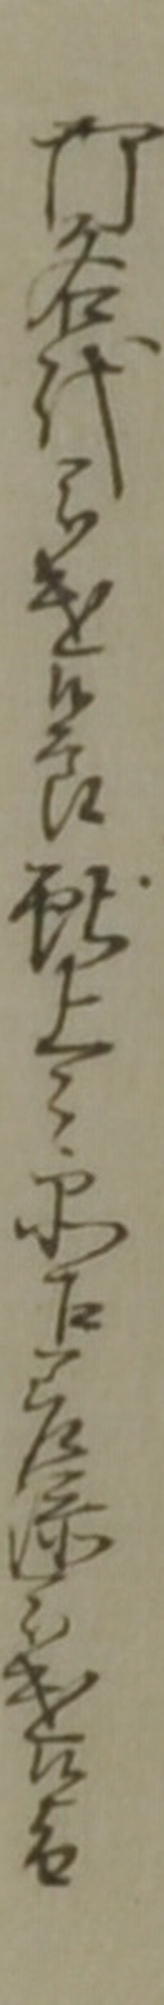御名代被遣候節献上之品江差添被遣候旨
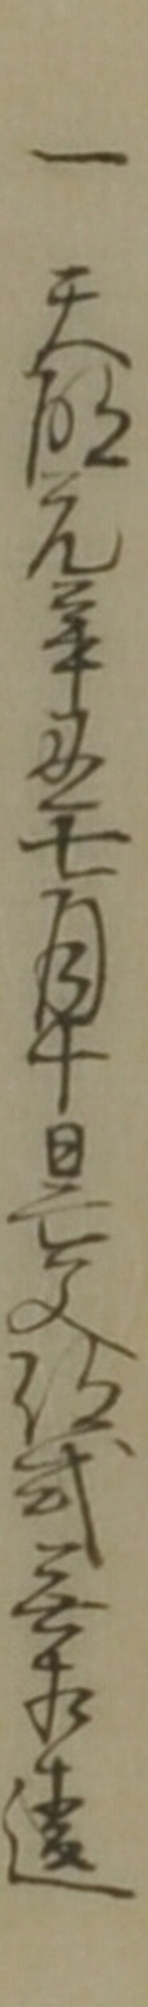一天明元辛丑七月十日亡父跡式無相違
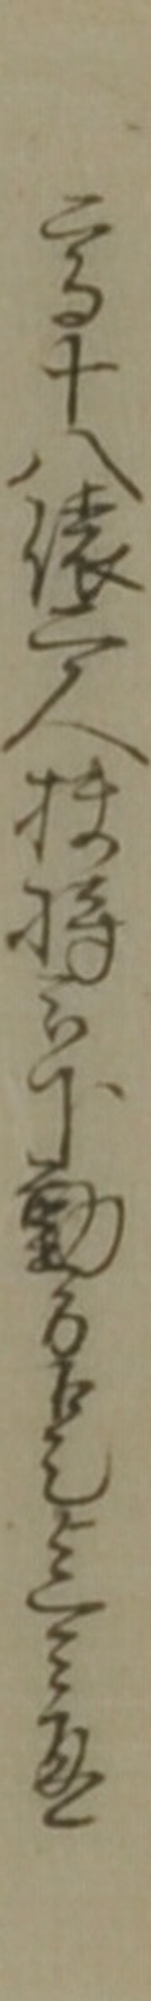高十八俵二人扶持被下勤方是迄之通
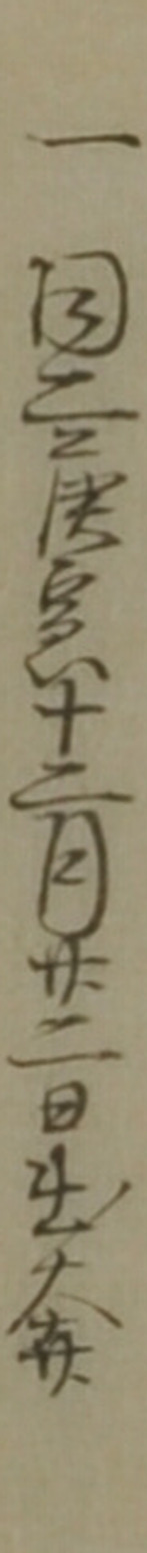一同二庚寅十二月廿ニ日出奔
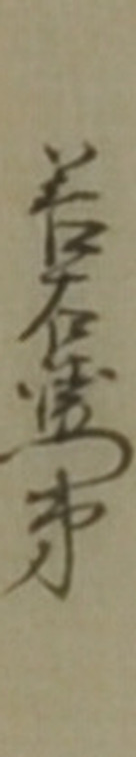善右衛門弟
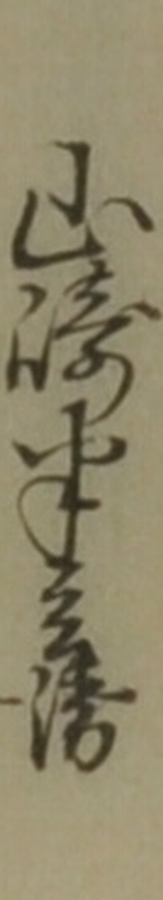山崎半兵衛
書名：無足廃家（壱）
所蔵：伊那市立高遠町図書館・合同会社AMANE
